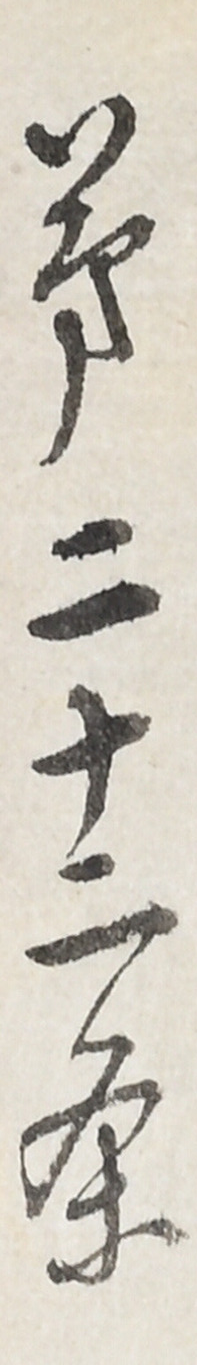第二十二条
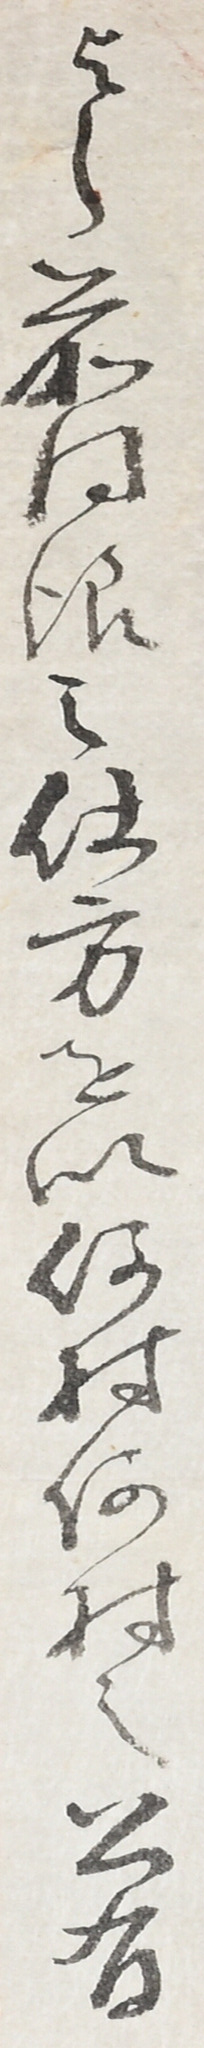とし前同様之仕方を以何村何村之公有
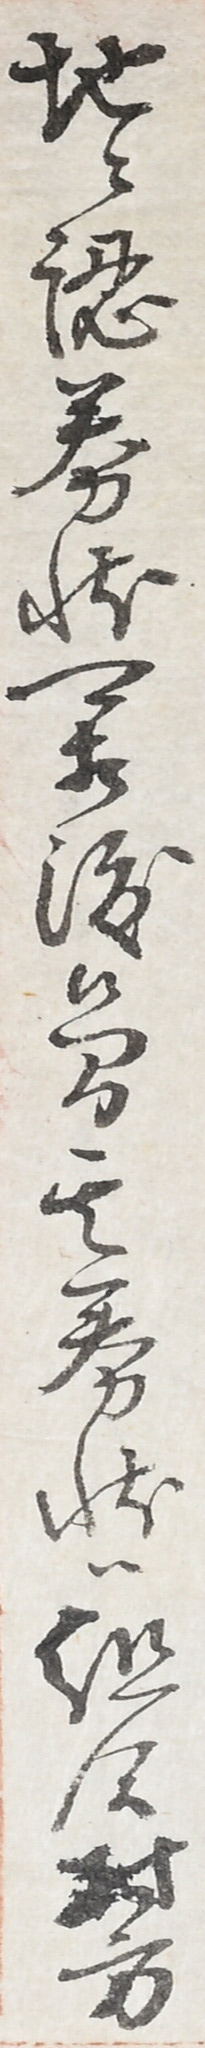地と認券状可相渡候間其券状は組合村方
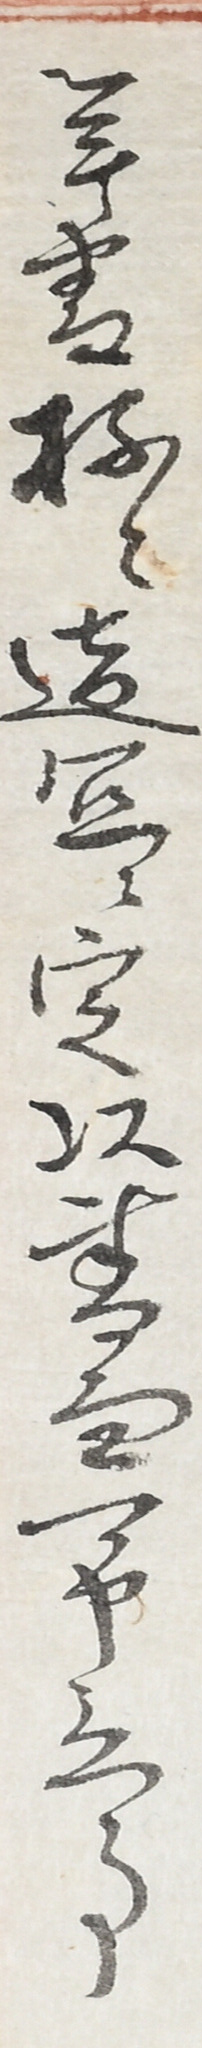年番抔と適宜に定以書面可申立事
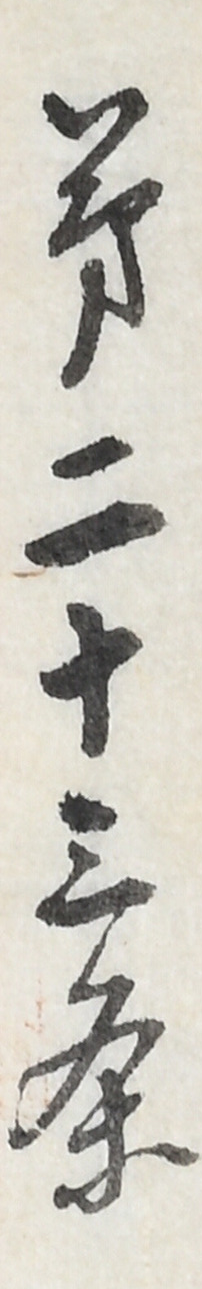第二十三条

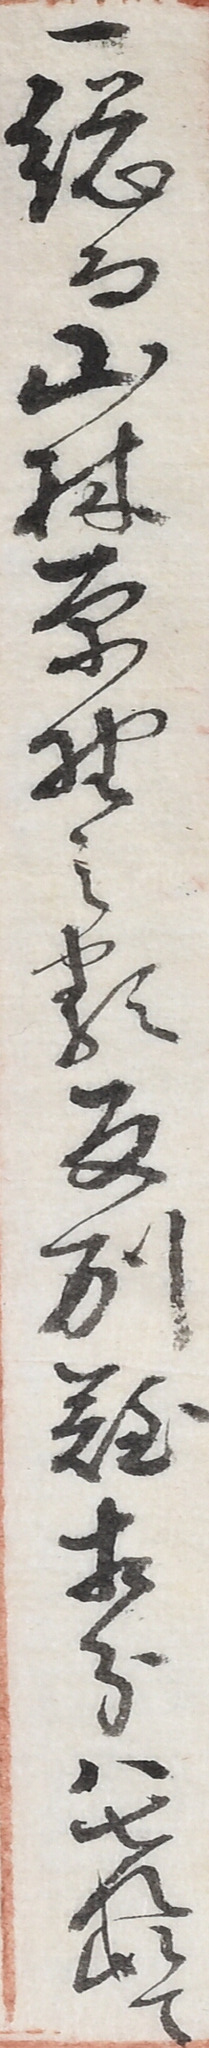一総而山林原野之類反別難相分ハ先以て
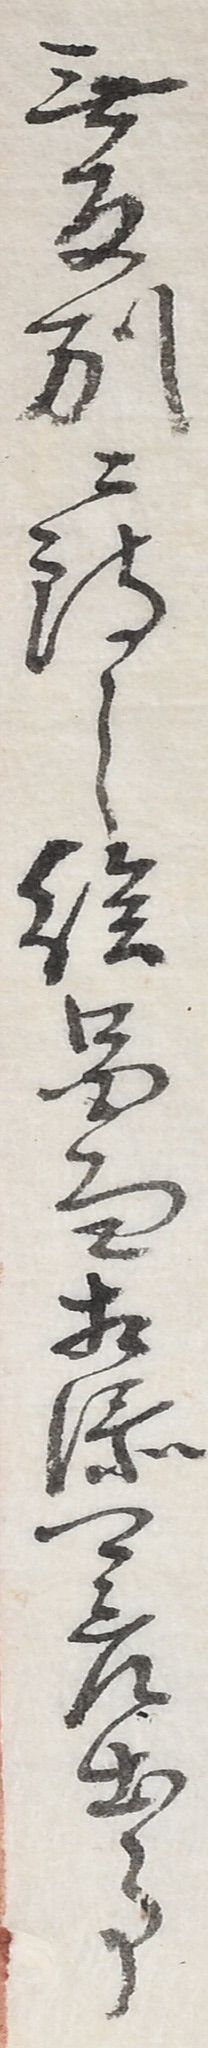無反別に致し絵図面相添可差出事
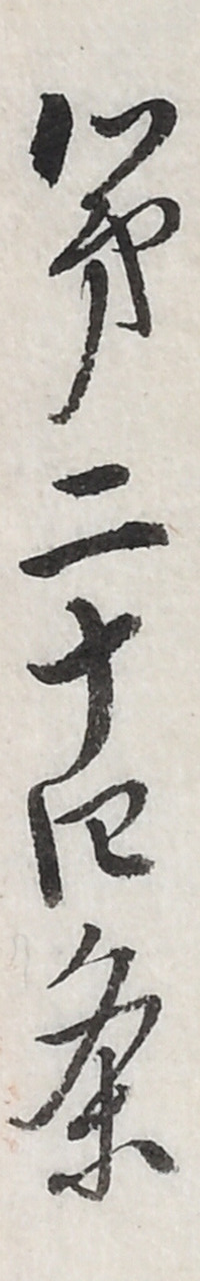第二十四条
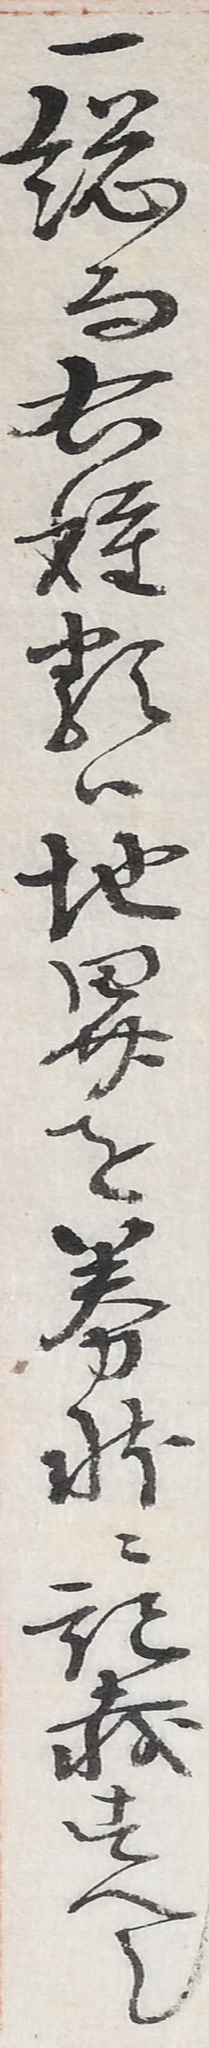一総而右種類は地界を券状に記載すへし
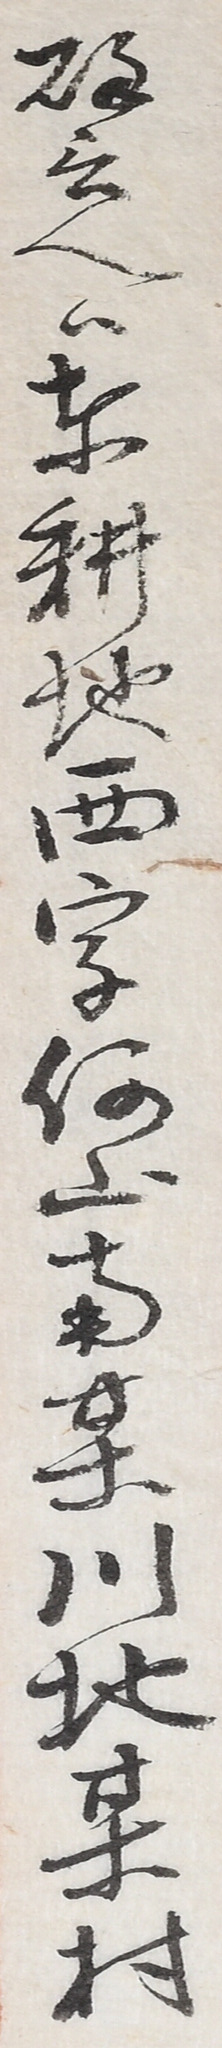譬へは東耕地西字何山南某川地某村
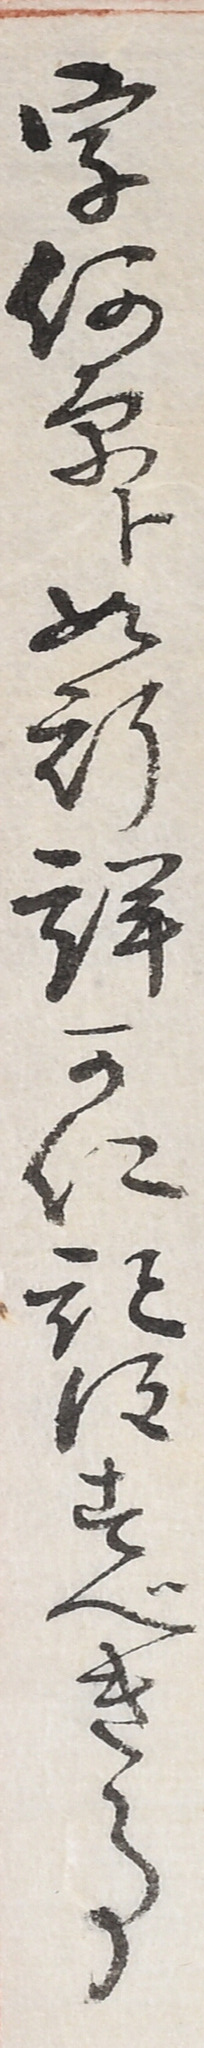字何原と如斯詳かに記注すべき事
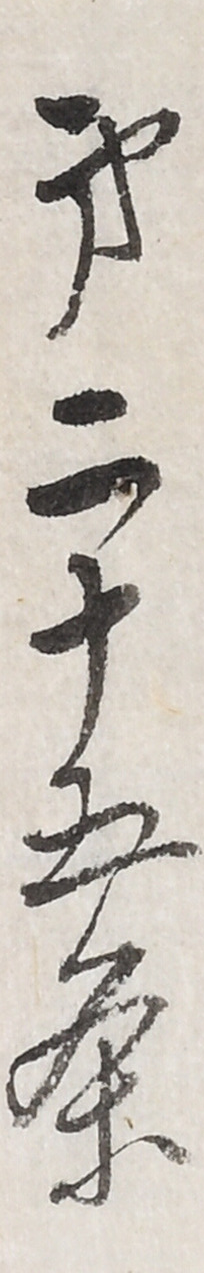第二十五条
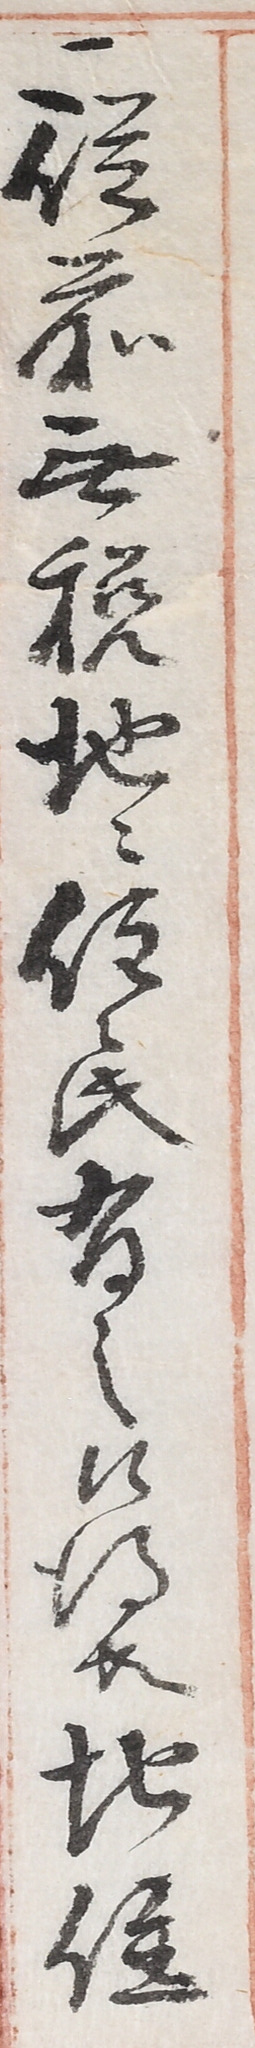一従前無税地に住民有之候得共地住
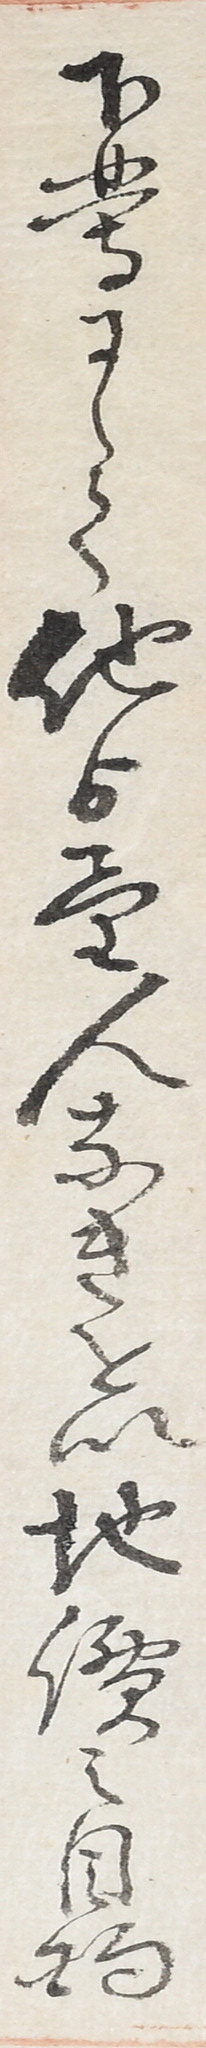下等にして他より望人なきを以地価之目的
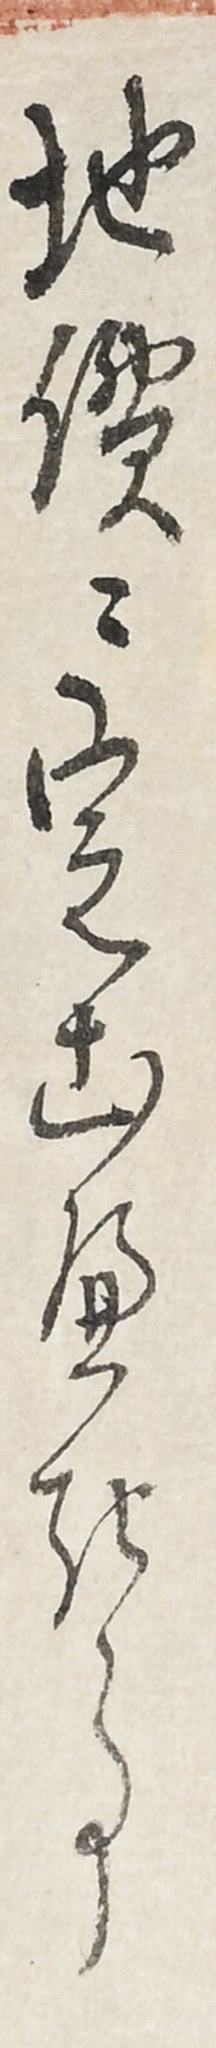地価に定出へき事
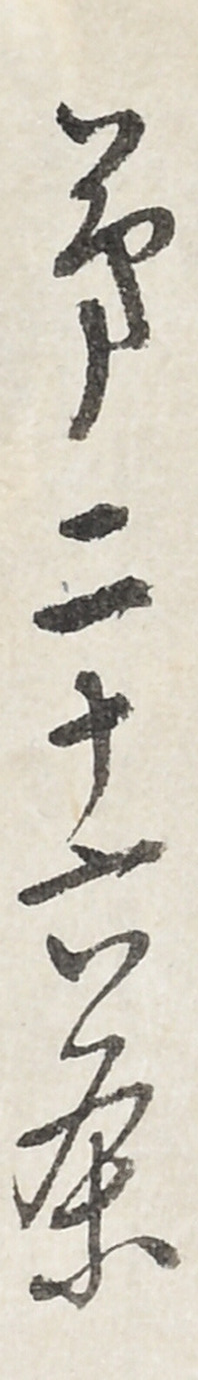第二十六条
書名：壹番・御布告一式
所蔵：伊那市立高遠町図書館・合同会社AMANE
